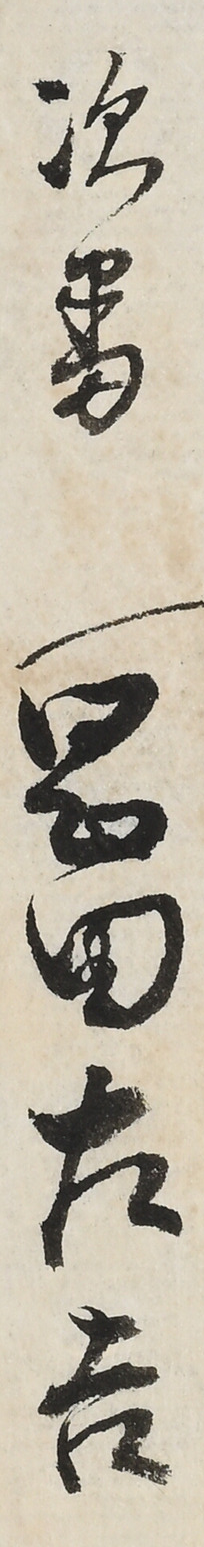次番岡田左吉
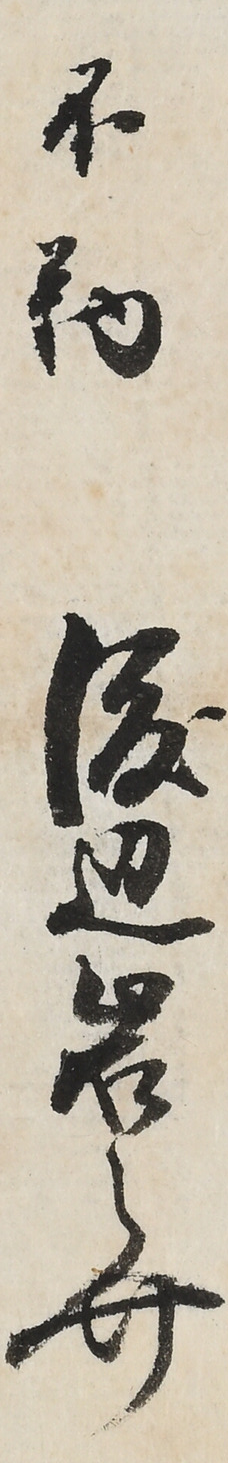不勤渡辺岩之介
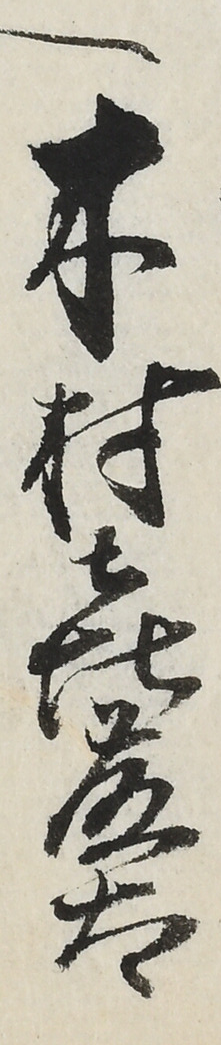木村喜藤太
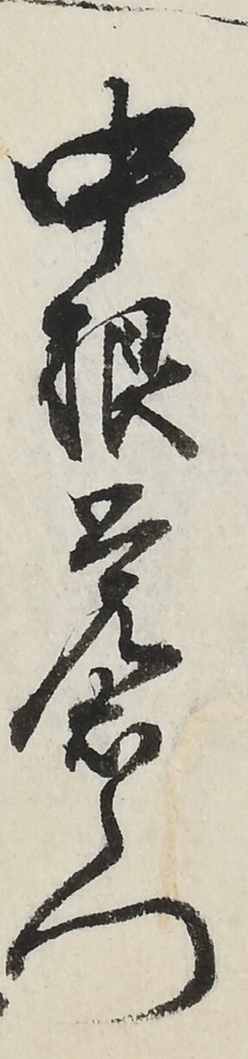中根覚右衛門
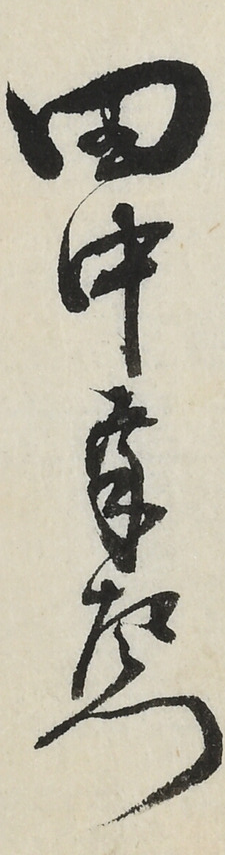田中幸左衛門
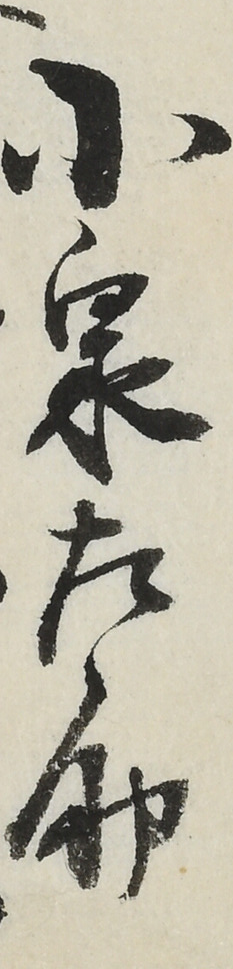小泉左助
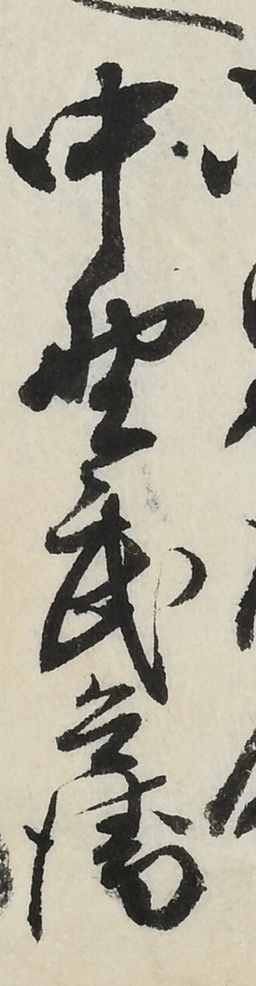中野武兵衛
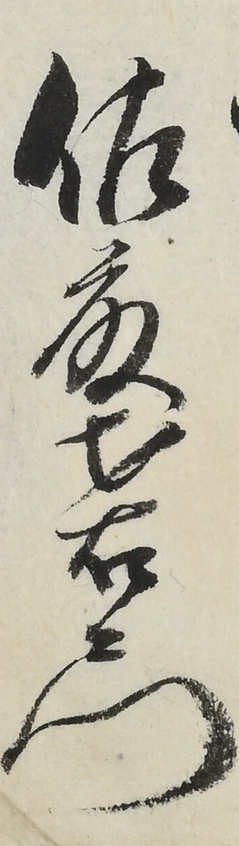佐藤才右衛門

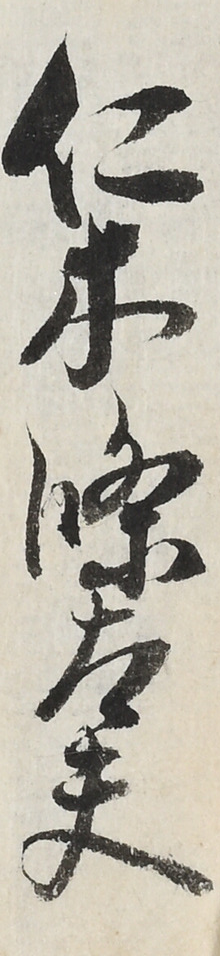仁木條太夫
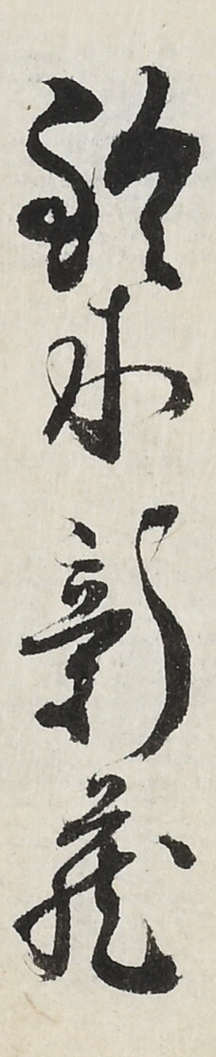鈴木新蔵
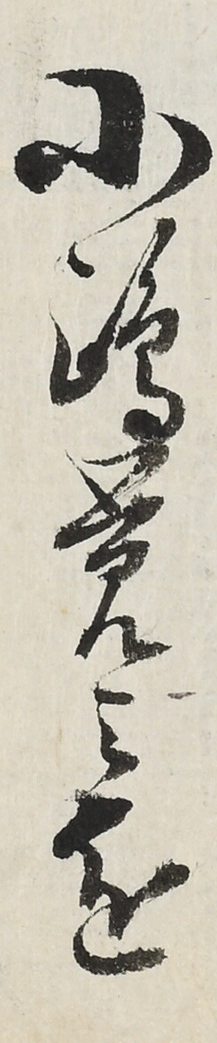小嶋覚之進
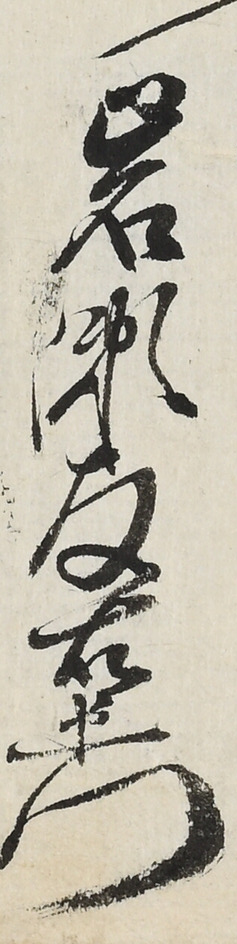岩瀬友右衛門
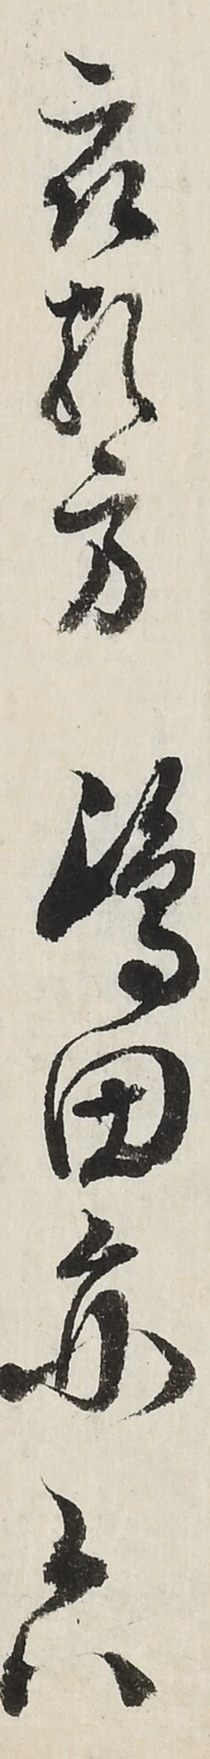衣類方嶋田亦六
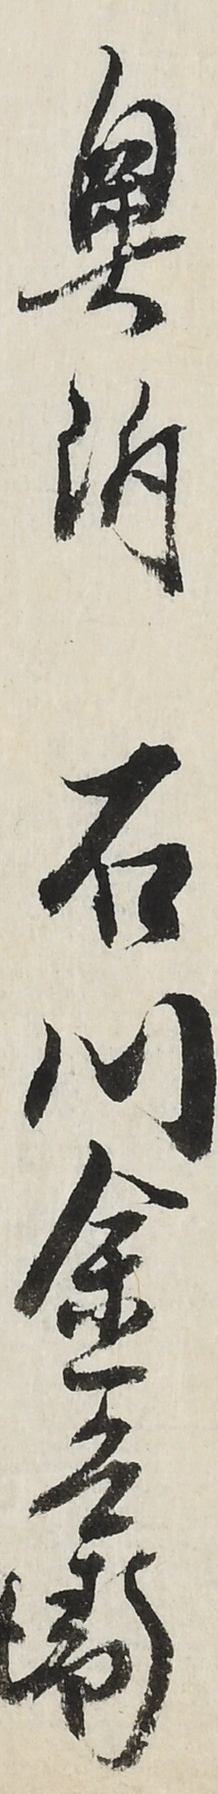奥付石川金兵衛
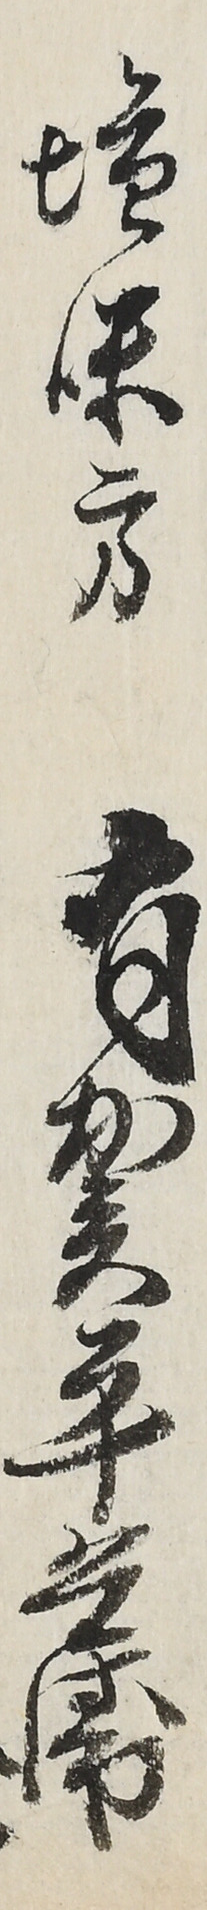塩味方有賀平兵衛
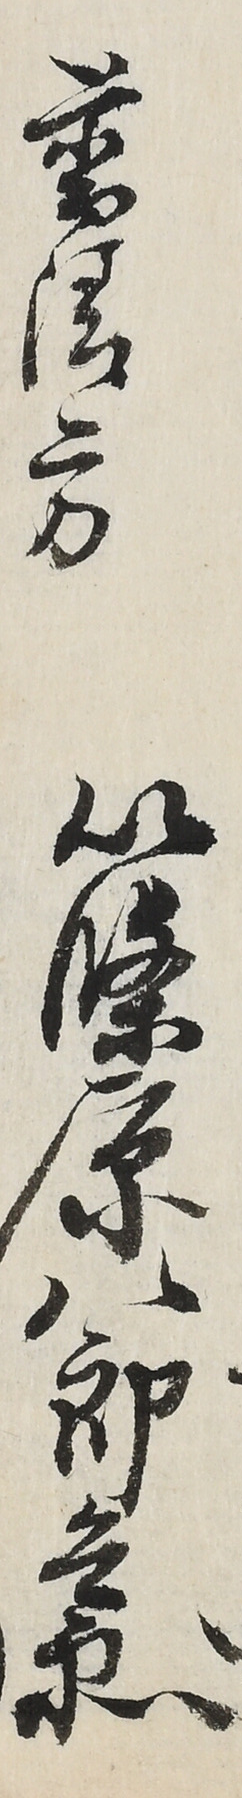普請方篠原八郎兵衛
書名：高遠江戸徒以上之面々
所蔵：伊那市立高遠町図書館・合同会社AMANE
